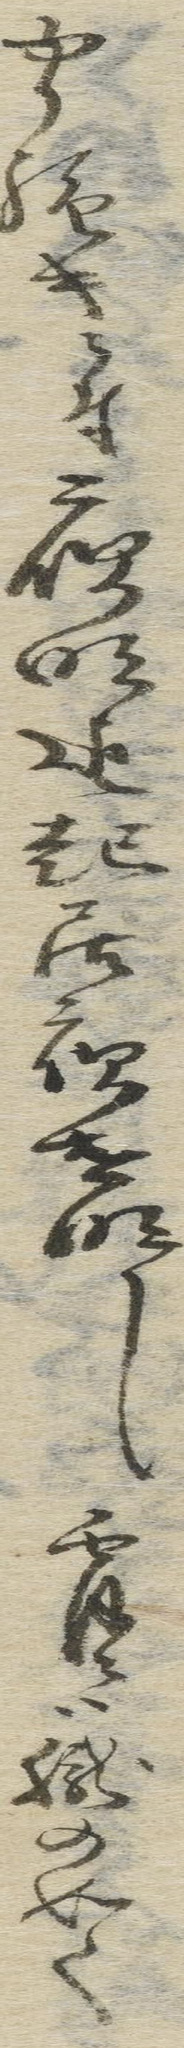ゆり強キ二付夜明迄起居夜を明し宵二ハ朧の如く
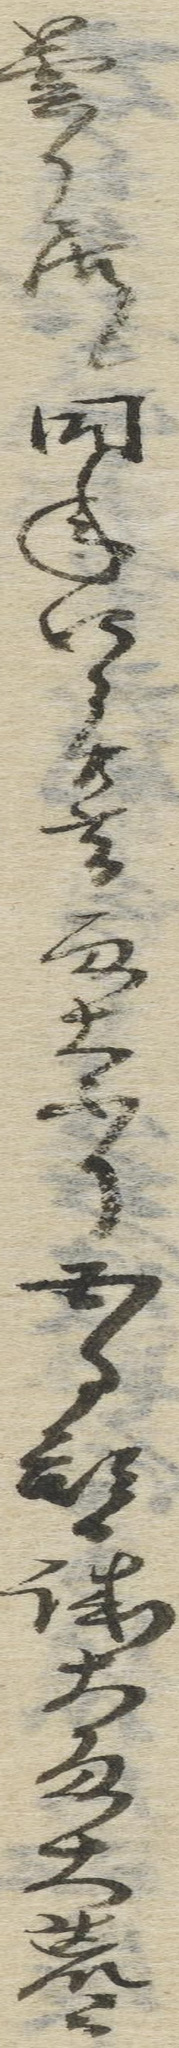曇り居候同年四月廿六日雨大ふり五月朔日誠大雨大荒二而
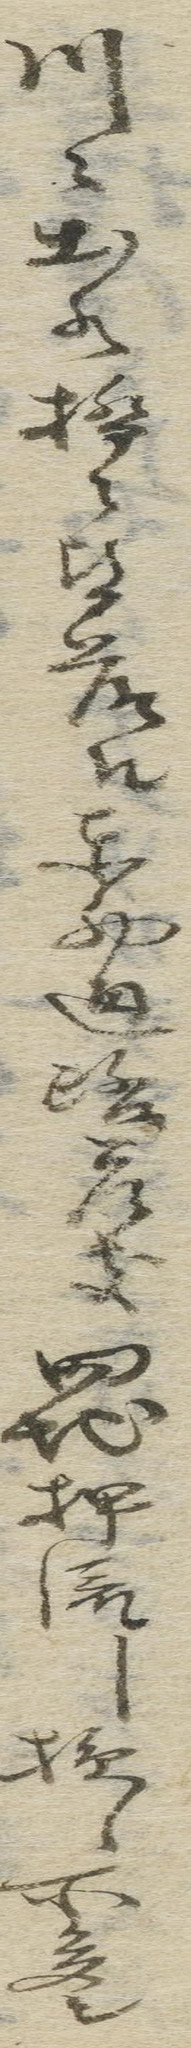川々出水橋々皆落候東西通路差支田地押し流し損候所多シ
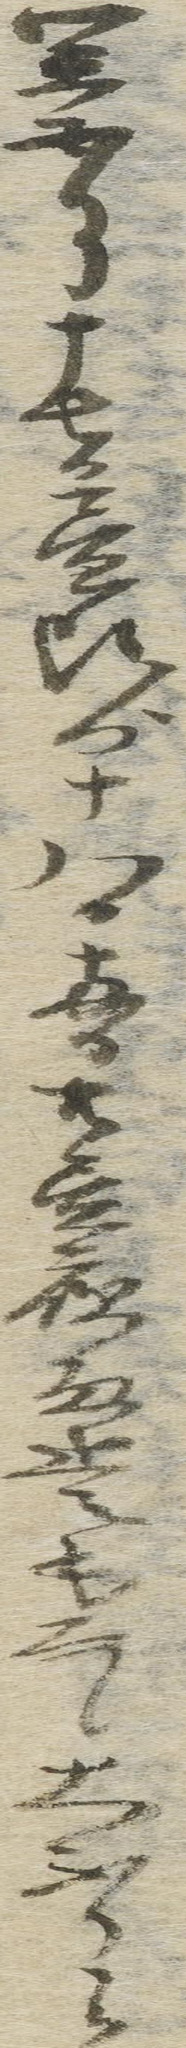閏五月十七日昼頃ゟ十八日両日共昼夜雨止ミも無之大ふり二而
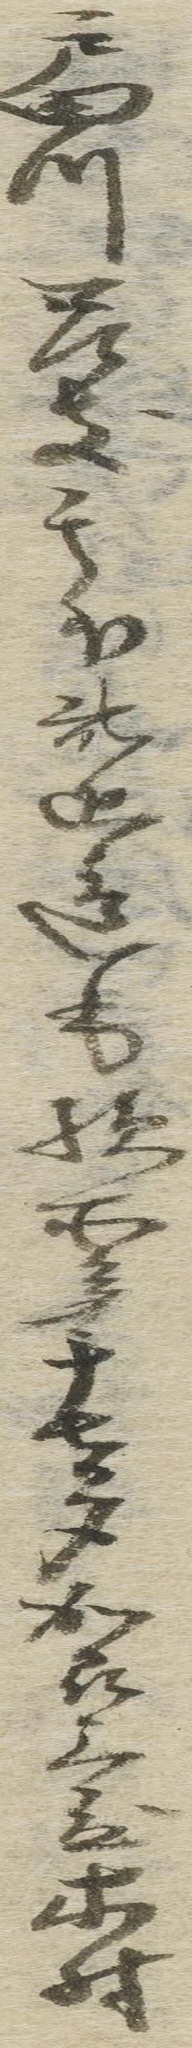戸田川差支其外此廻辺も損所多十七日夕加州三度木村
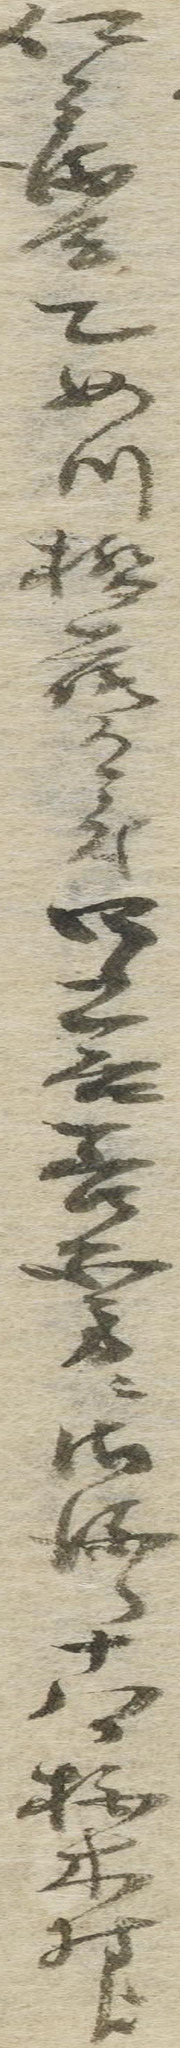仁兵衛殿乙女川橋落候二付問屋善兵衛方二御泊り十八日柏木村江
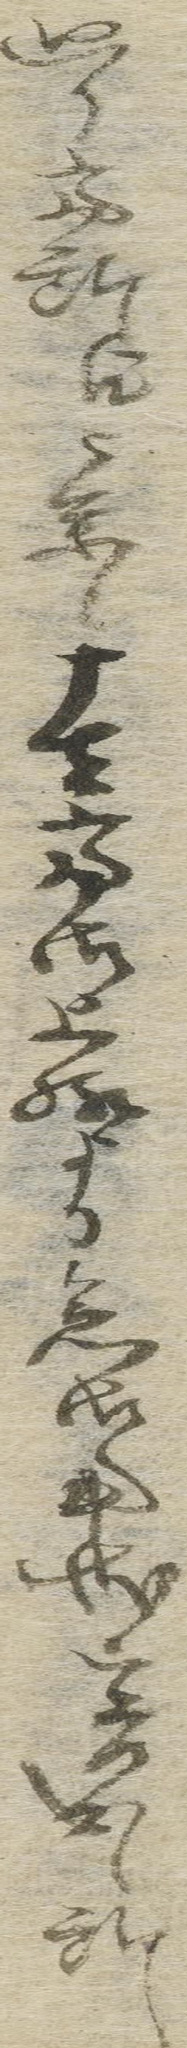廻り当所江被参候十七日当御上様より急御用状差出候所
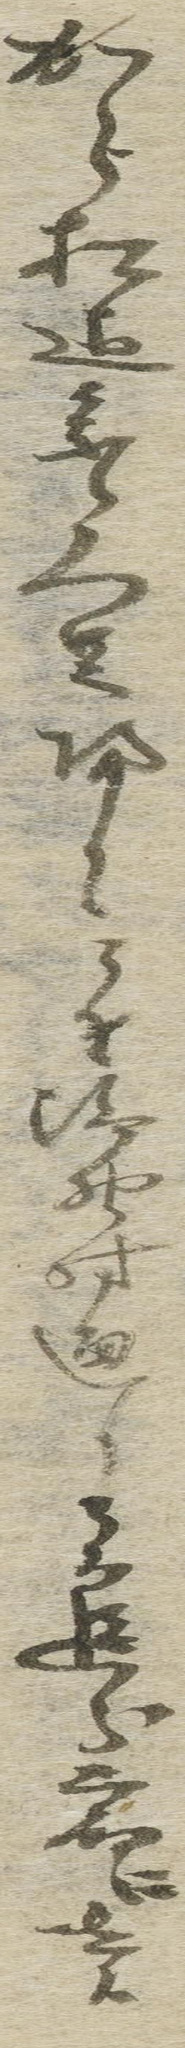から松迄参候人足帰候二付塩野村通り二而追分宿江遣候
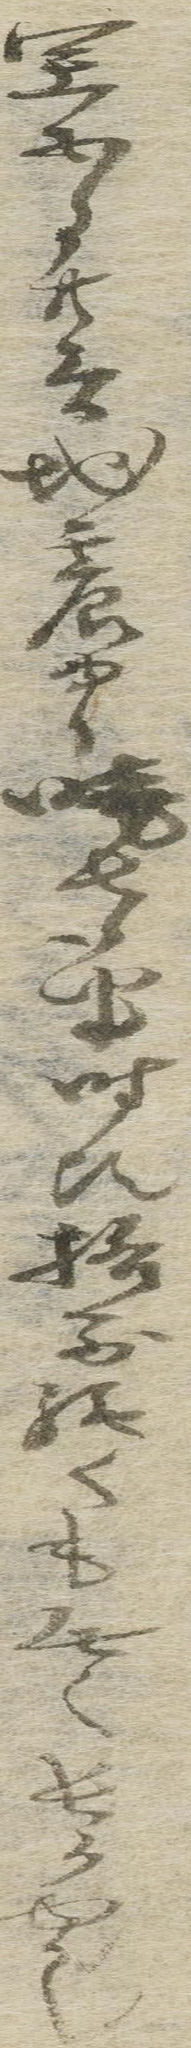閏五月廿三日地震ゆり暁七ッ半時頃格別強くも無之長々ゆり
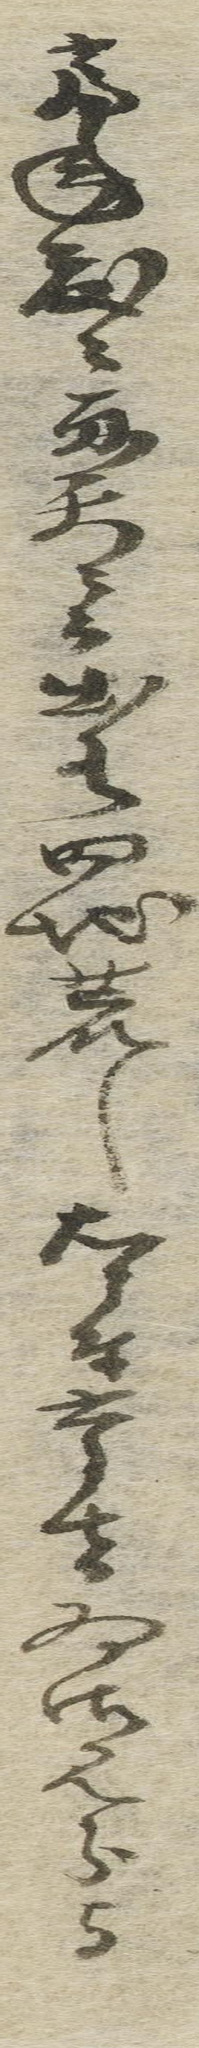当年度々雨天二而出水田地荒し右二付六月十日為御見分と
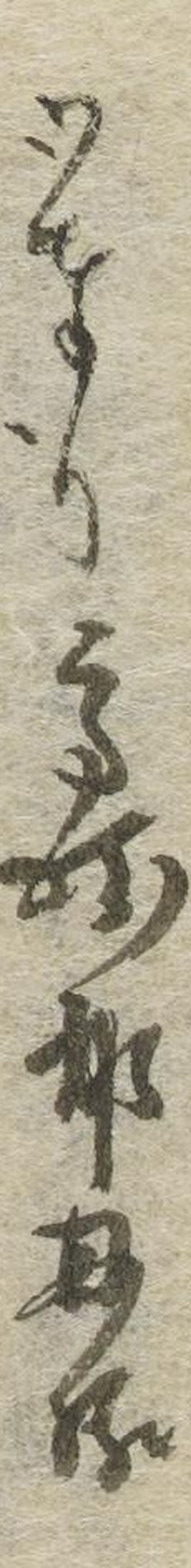御奉行高崎丑様
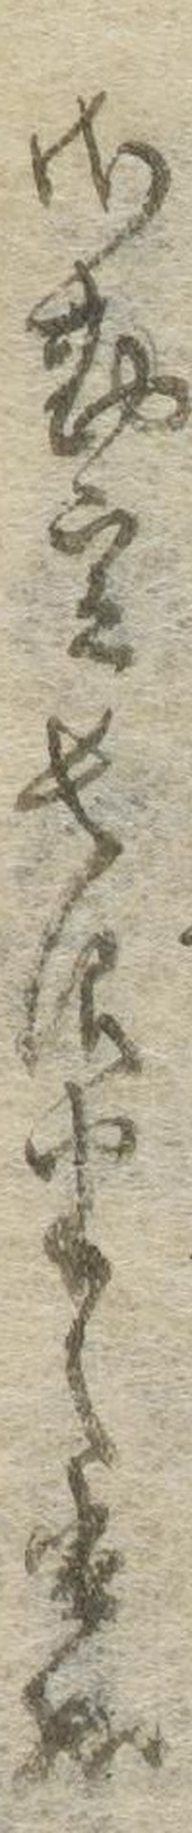御勘定長沢半之丞様

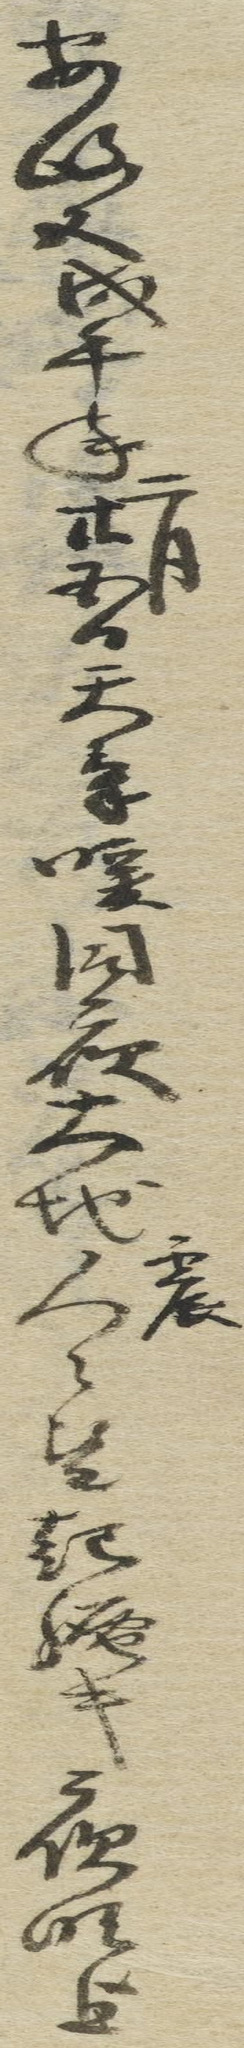安政五戌年二月廿五日天気暖同夜大地震人々皆起驚キ夜明迄
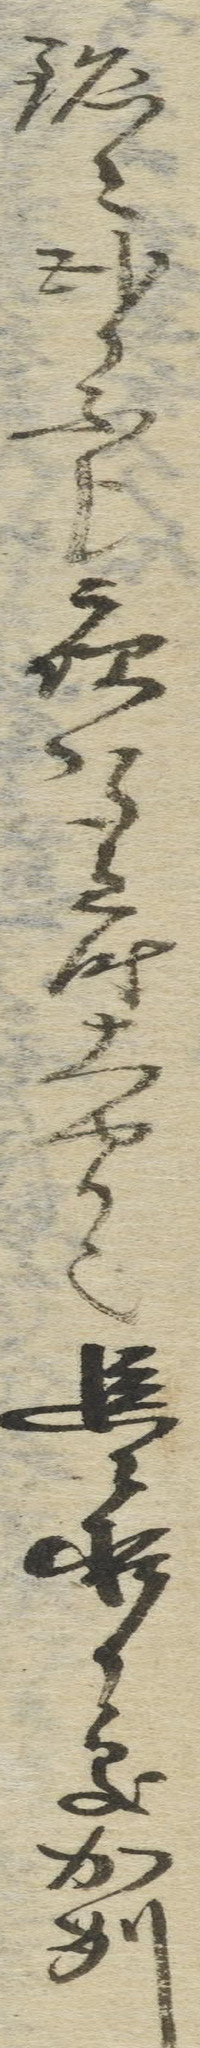銘々臥り不申夜八ッ過時大ゆり追々承り候処加州
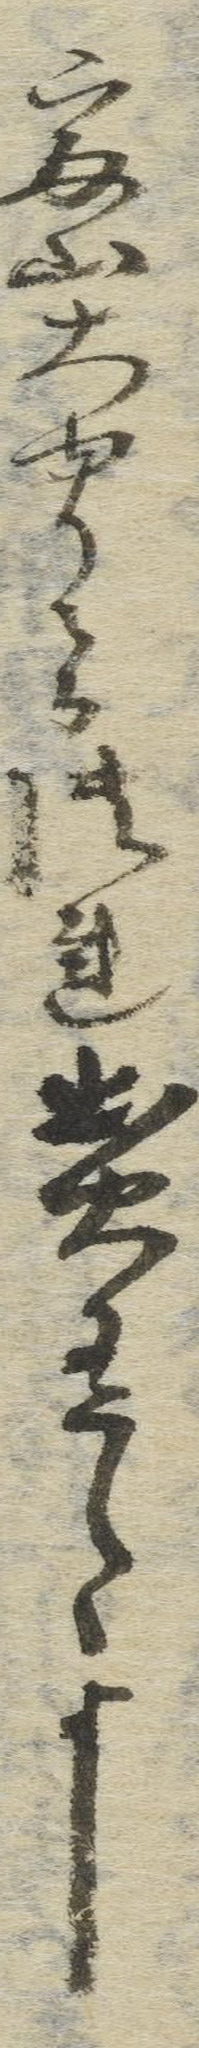鳶山大ゆり二而潰れ出火有之候よし
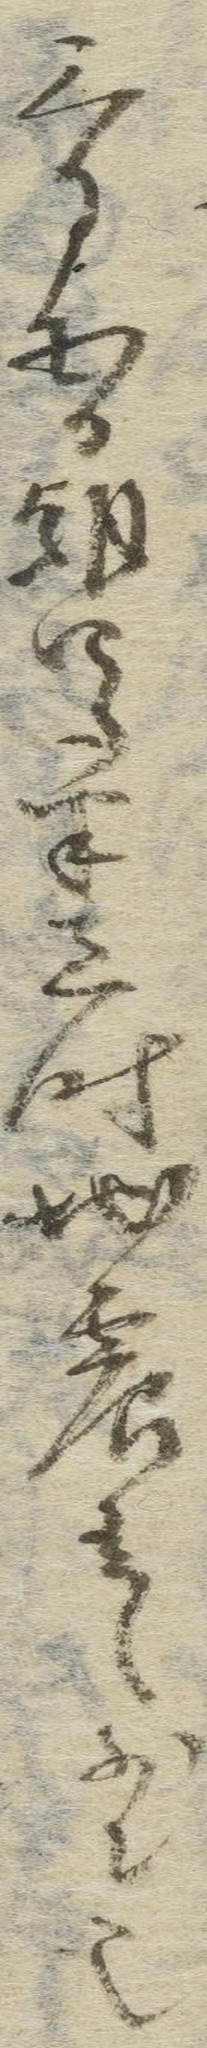三月五日朝四ッ半過時地震有之少し也
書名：信濃越後　地震書留
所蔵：東京大学地震研究所図書室 Earthquake Research Institute Library, The University of Tokyo, JAPAN
